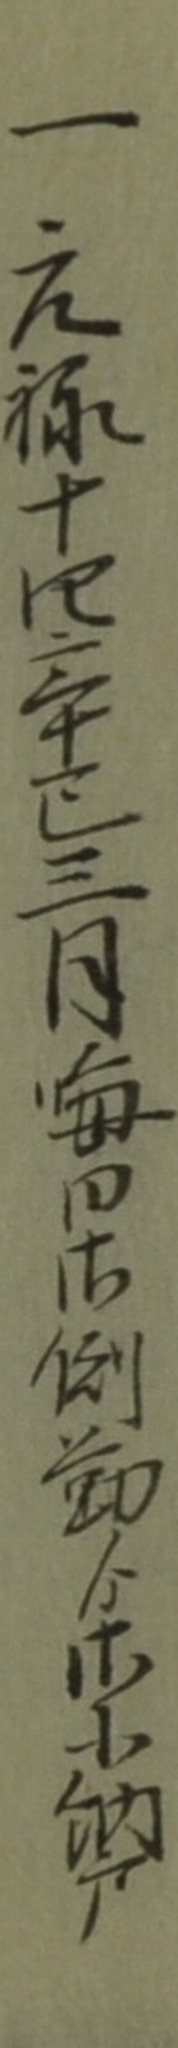一元禄十四辛巳三月晦日御側勤ゟ御小納戸
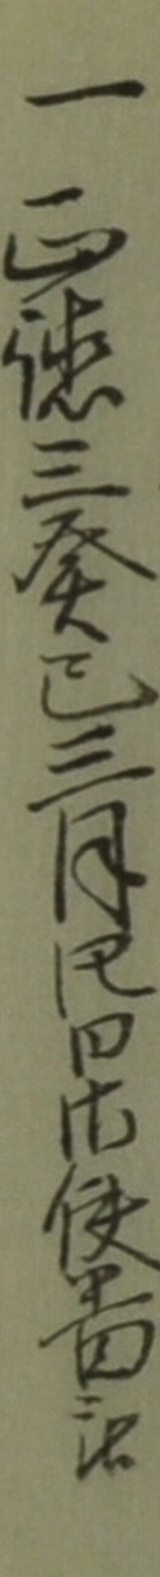一正徳三癸巳三月四日御使番被
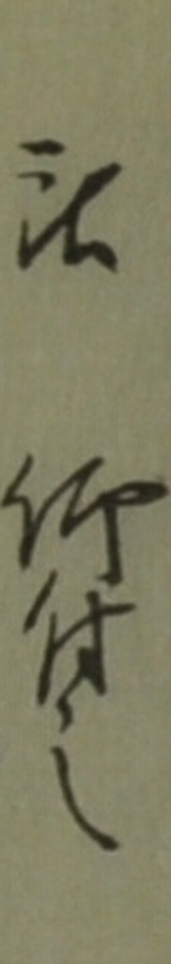被仰付之
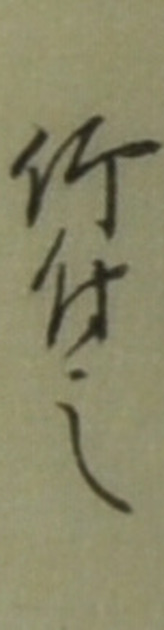仰付之

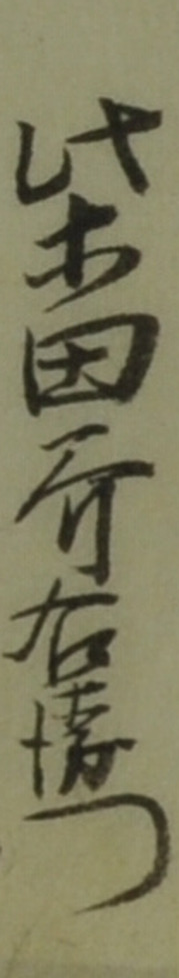柴田斧右衛門
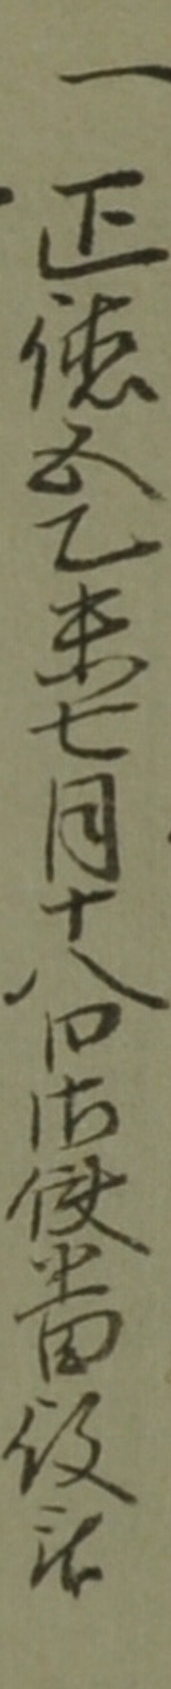一正徳五乙未七月十八日御使番役被
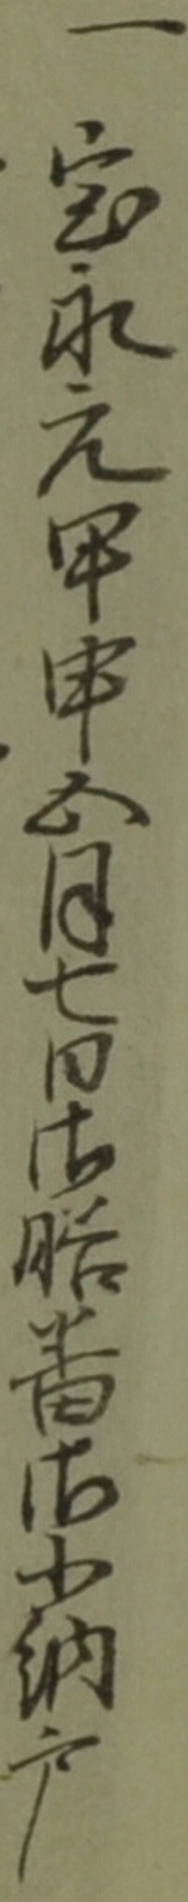一宝永元甲申五月七日御膳番御小納戸
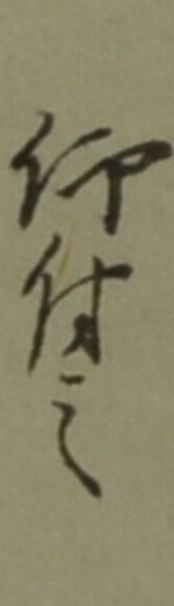仰付之
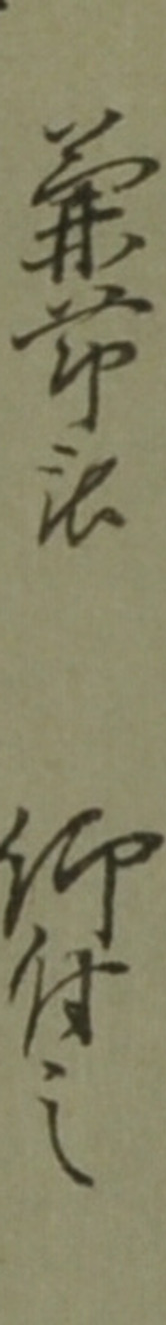兼帯被仰付之
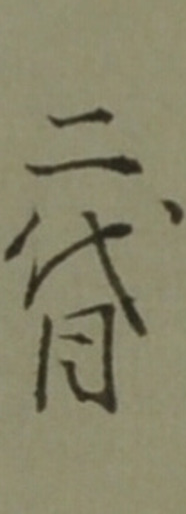二代目
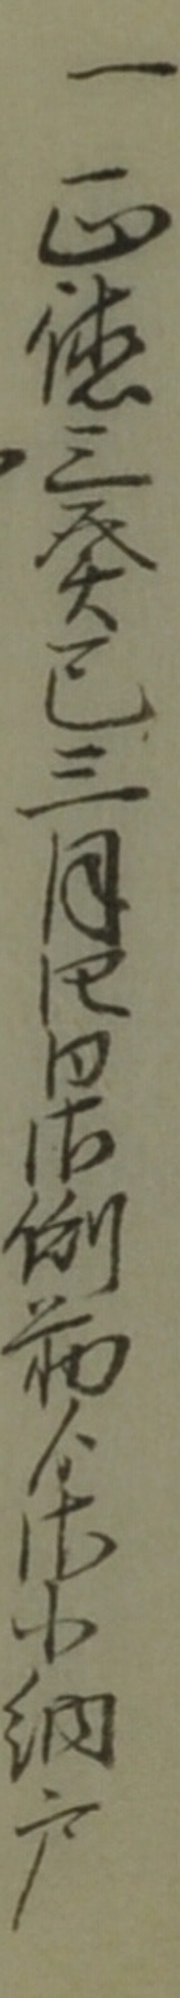一正徳三癸巳三月四日御側勤ゟ御小納戸
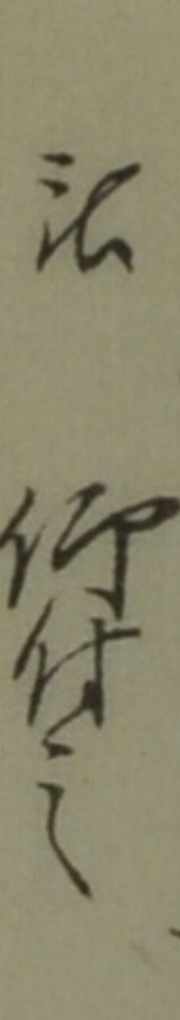被仰付之
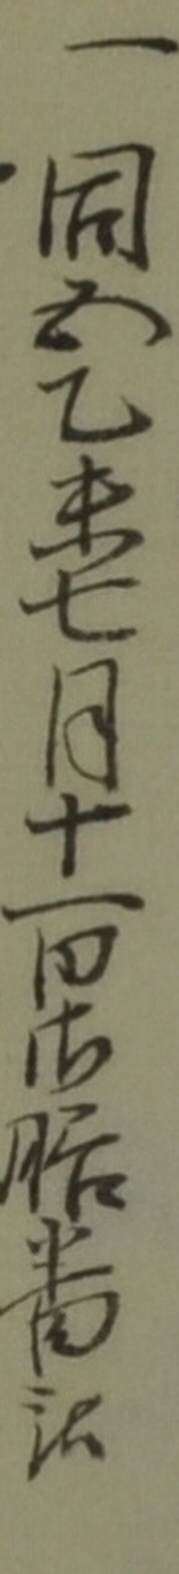一同五乙巳七月十一日御膳番被
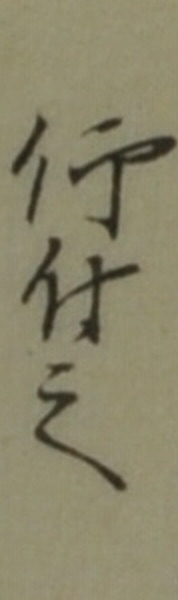仰付之
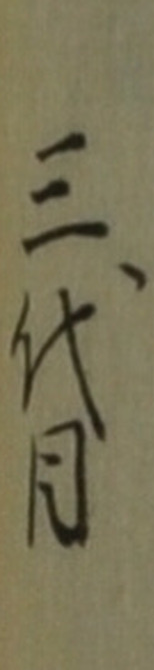三代目
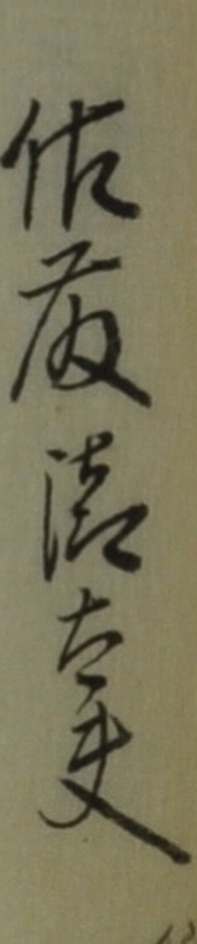佐藤清太夫
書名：諸御役代々録（四）
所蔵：伊那市立高遠町図書館・合同会社AMANE
